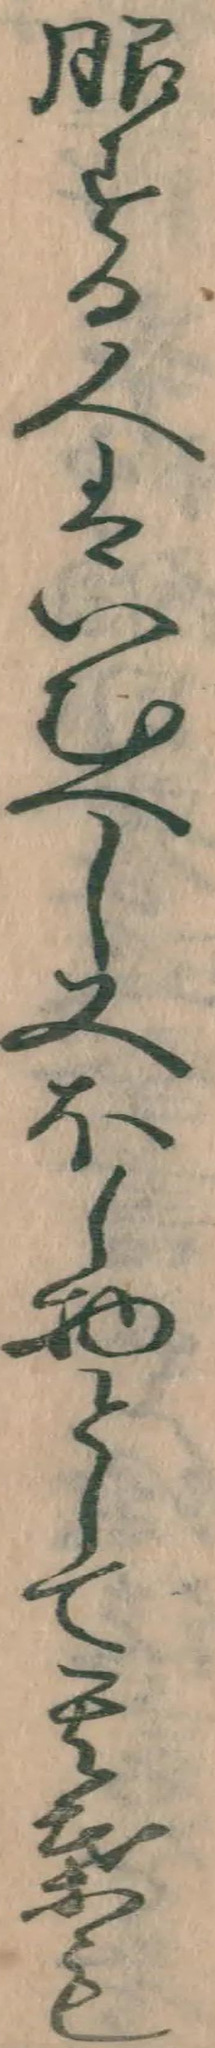服する人はいむへし又ほし物として其葉も
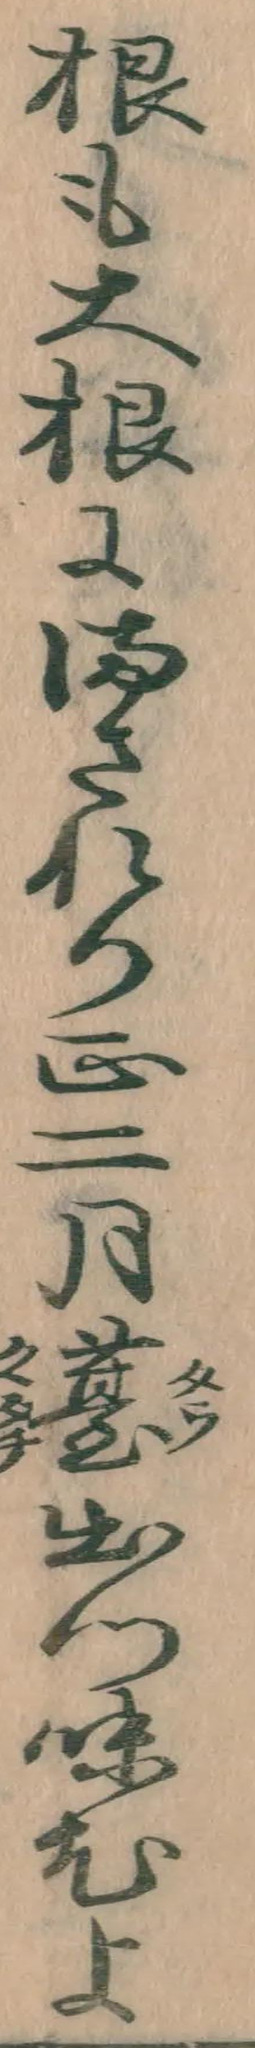根も大根にまされり正二月薹出つ味尤よ
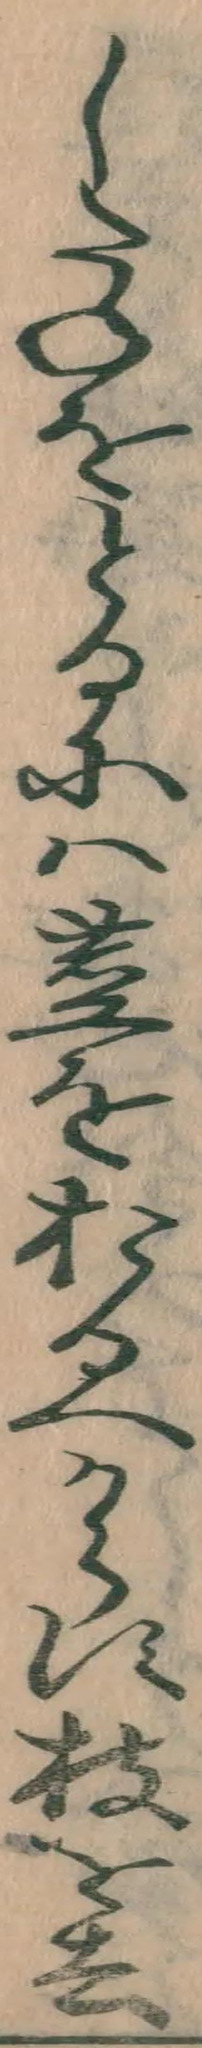したねをとるには茎をおるへからす枝を去
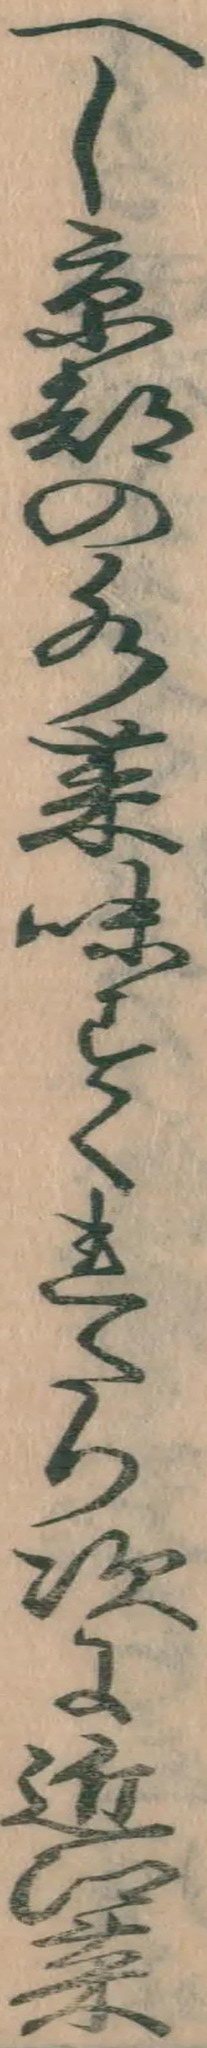へし京都の水菜味すくれたり次に近江菜
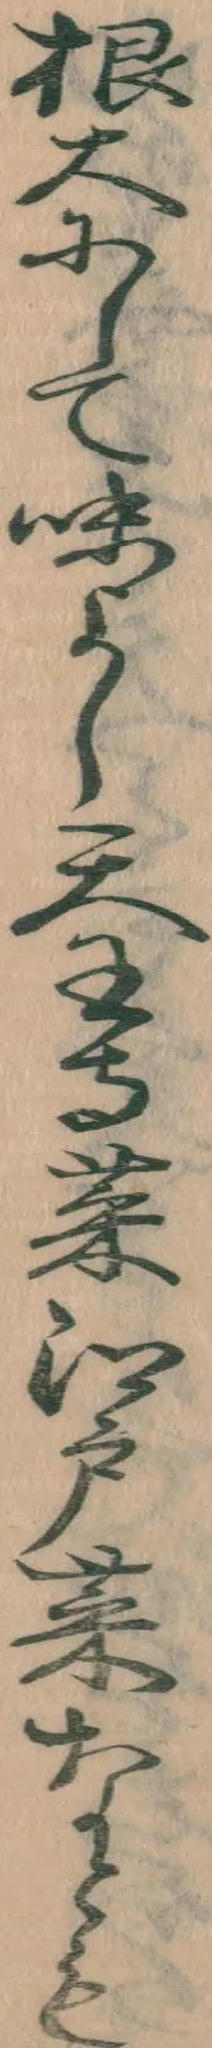根大にして味よし天王寺菜江戸菜なとも
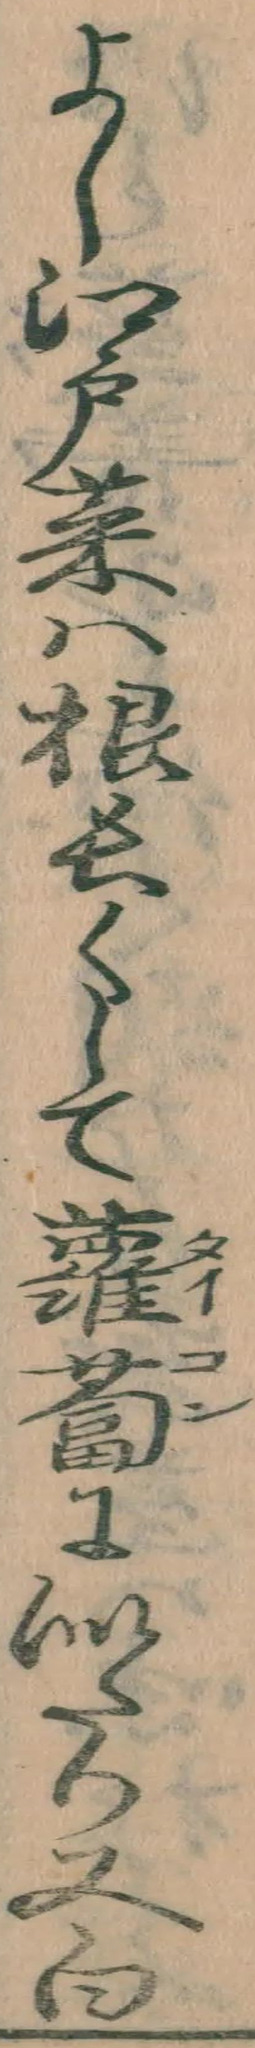よし江戸菜は根長くして蘿蔔ににたり又白
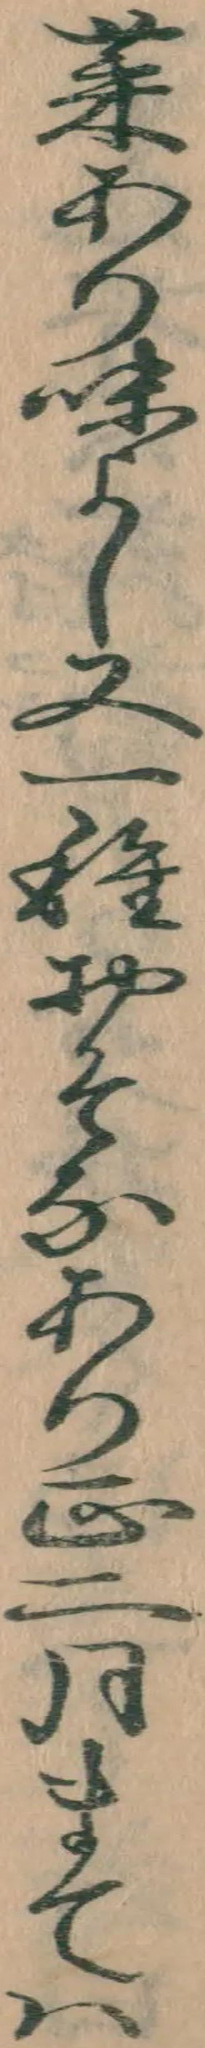菜あり味よし又一種おそなあり正二月まては
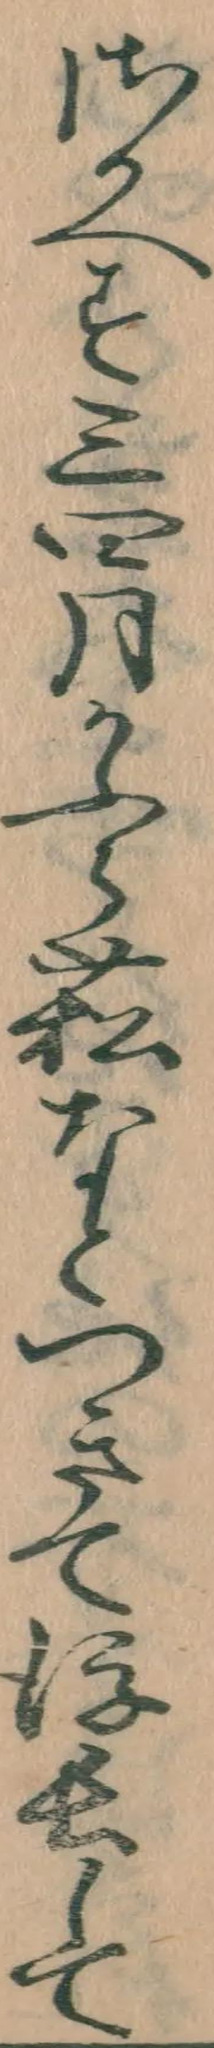さかへす三四月かふら菘なとつきて後長して
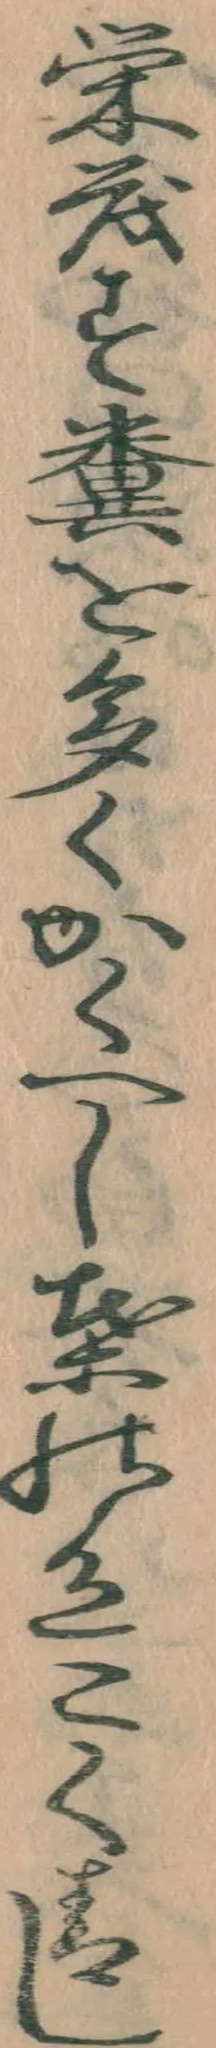栄茂す糞を多くかくへし葉の色こく青し
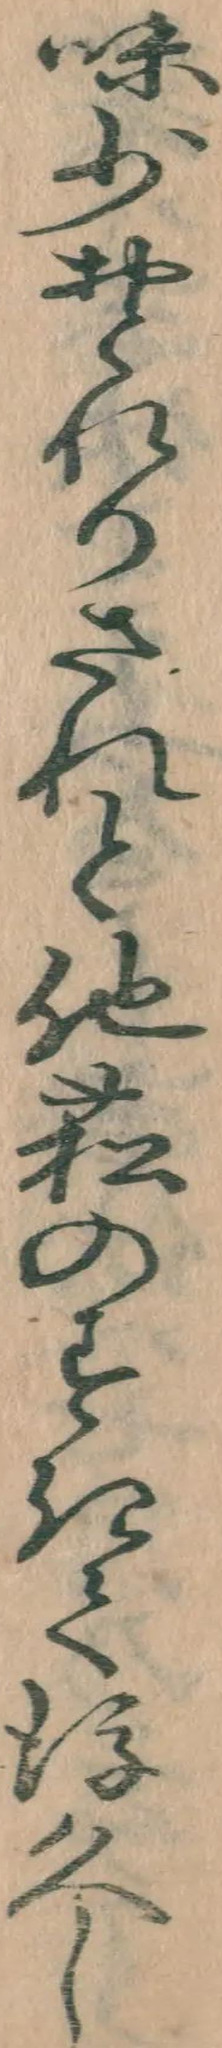味少おとれりされと他菘のすきて後久し
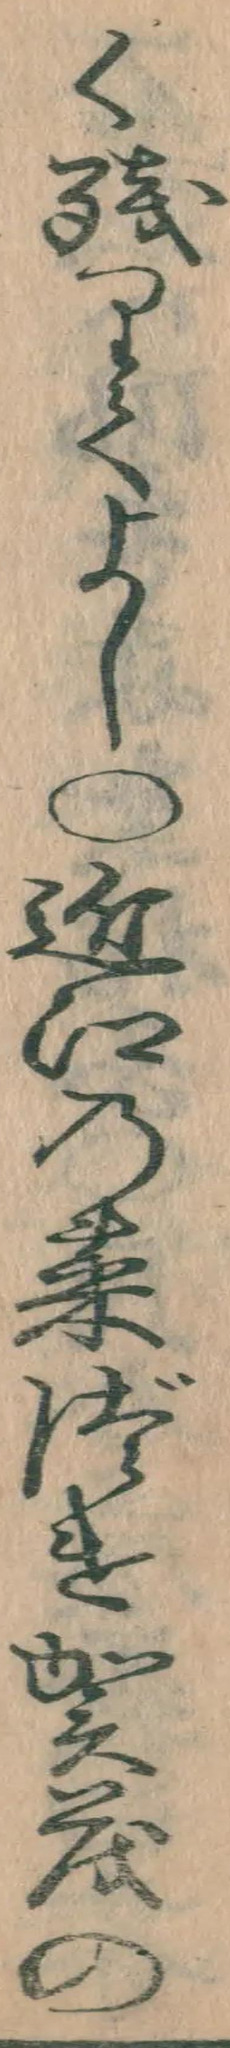く残りてよし〇近江の菜づけ賀茂の
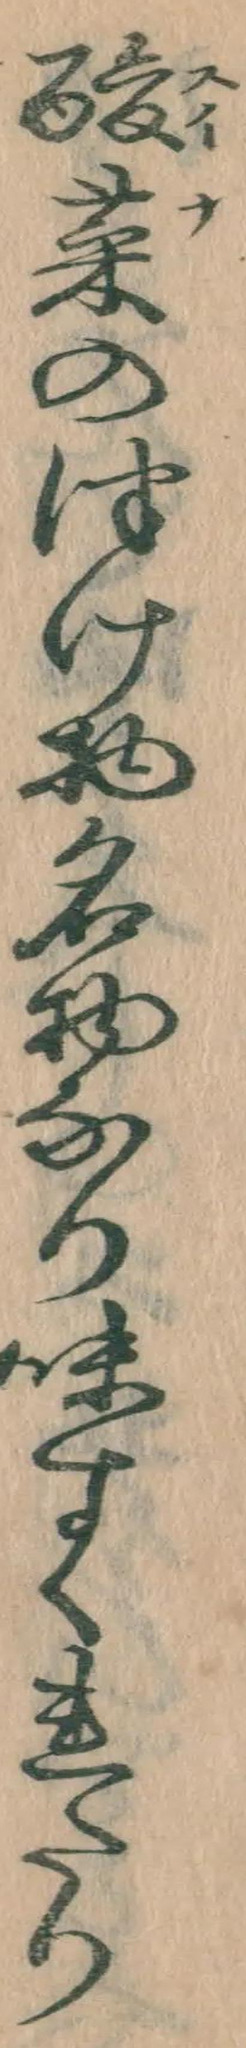酸菜のつけ物名物なり味すくれたり
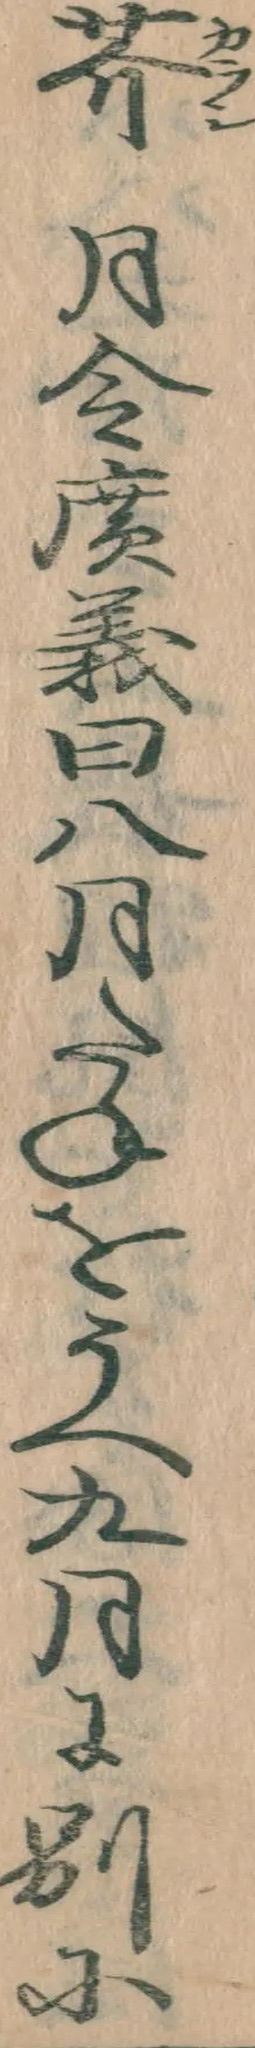芥月令広義曰八月たねをうへ九月に別に
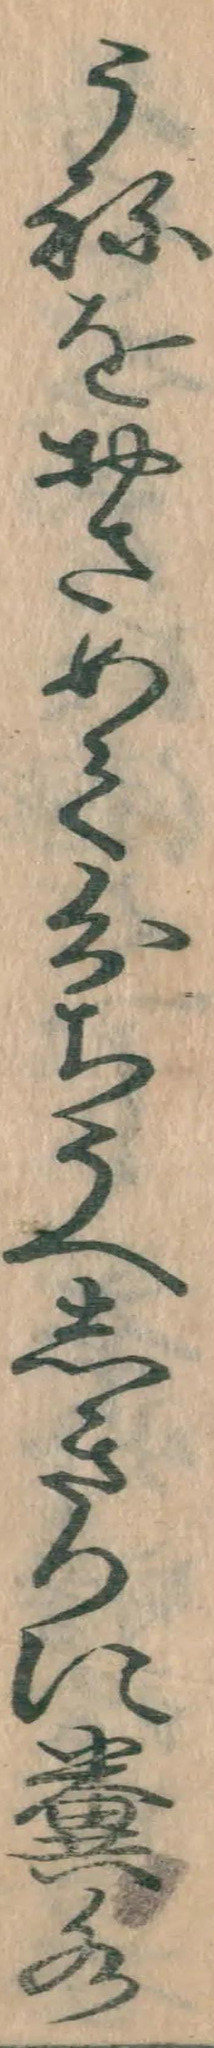うねをおさめて分ちうへしきりに糞水
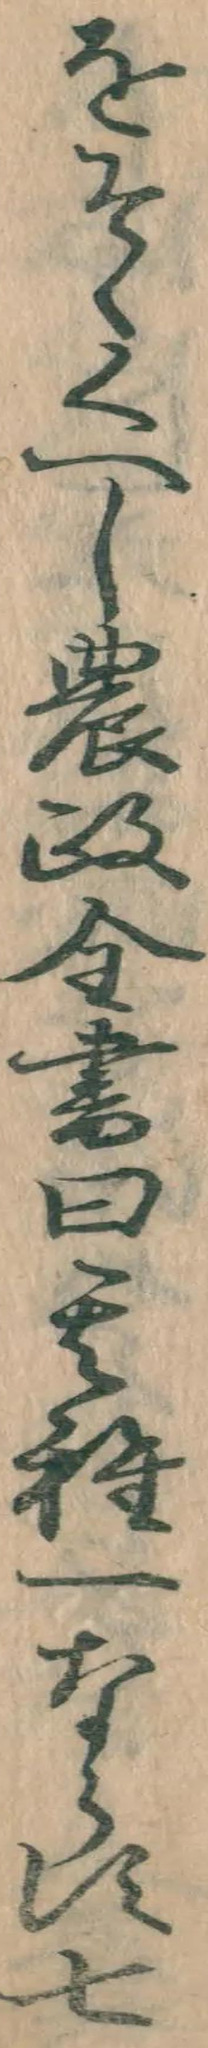をそゝくへし農政全書曰其種一ならす七
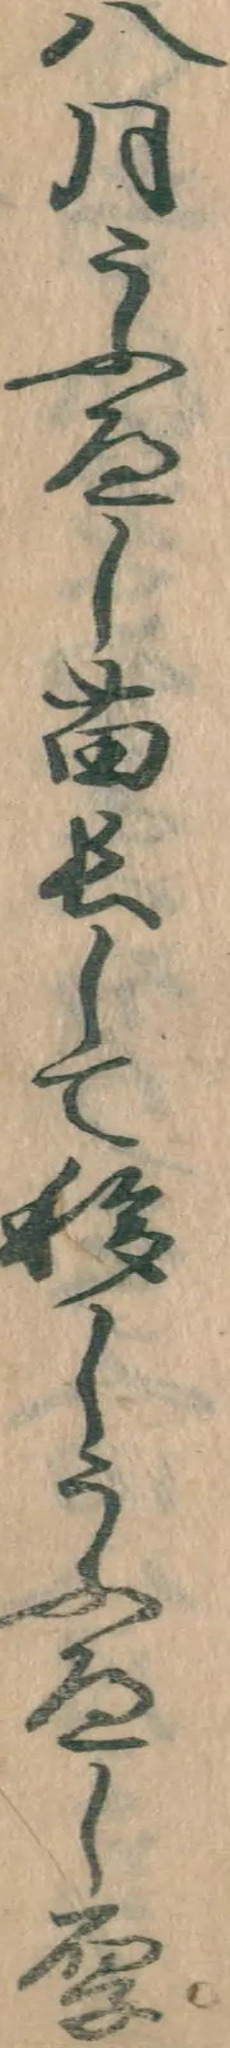八月うふへし苗長して移しうふへし厚
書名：菜譜 3巻
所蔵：国立国会図書館 National Diet Library, JAPAN
